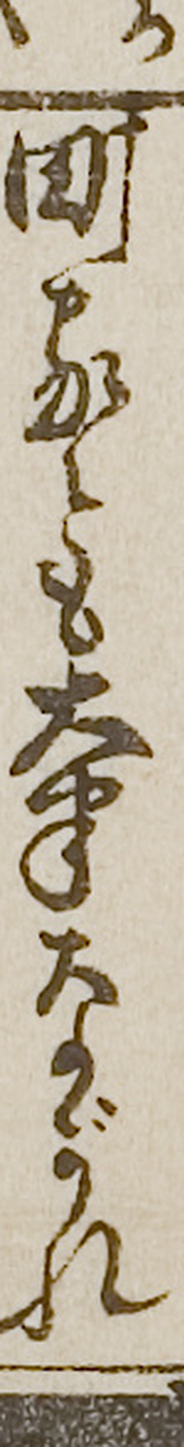町家とも大半ながれ
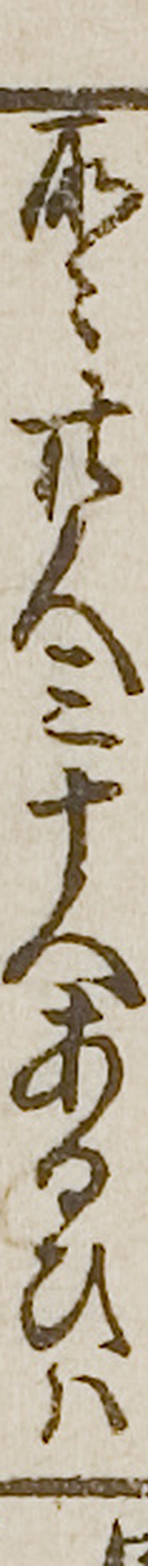所々廿人三十人あるひは
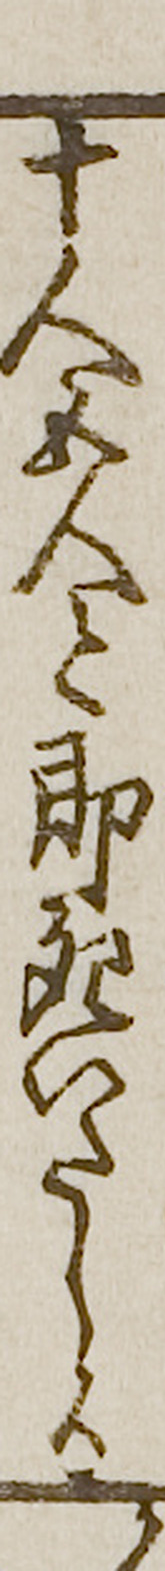十人五人と即死いたし候
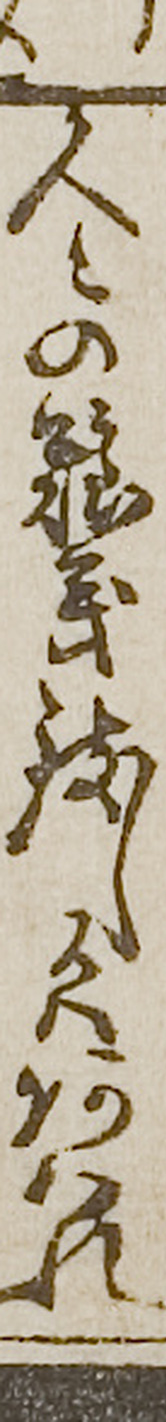人々の難義致し候はあはれ
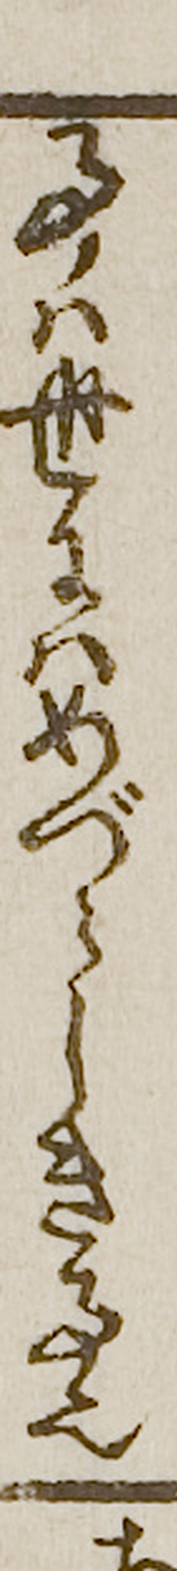事は世にはめづらしき事也
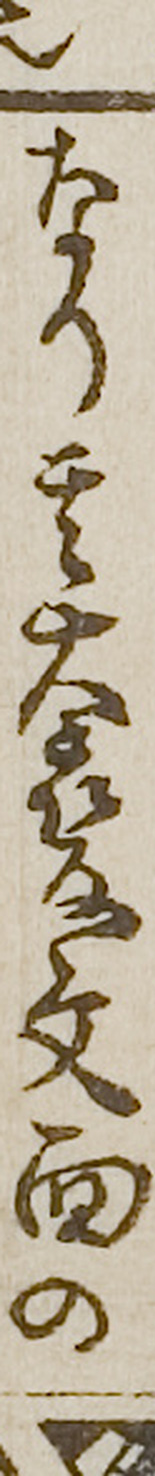なり其大変文面の
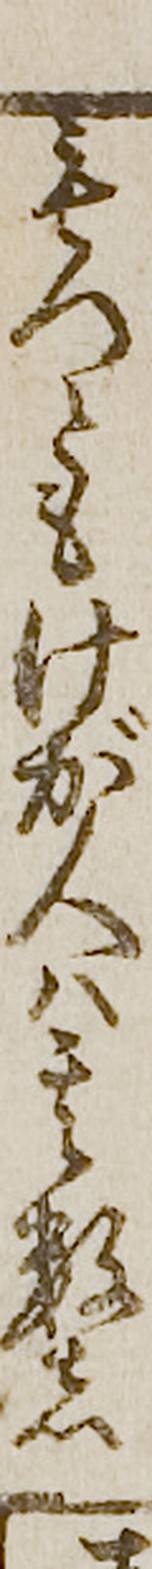もつともけが人は其数し
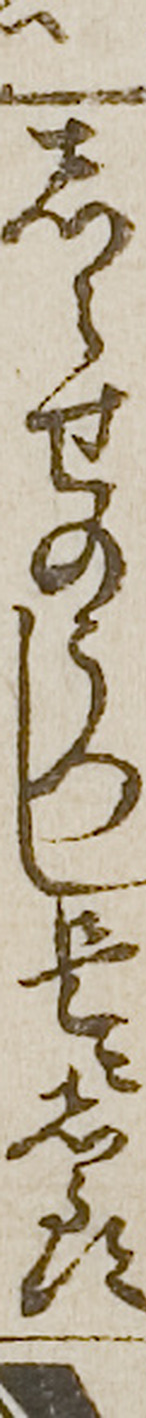しらせのうつし是にしるす
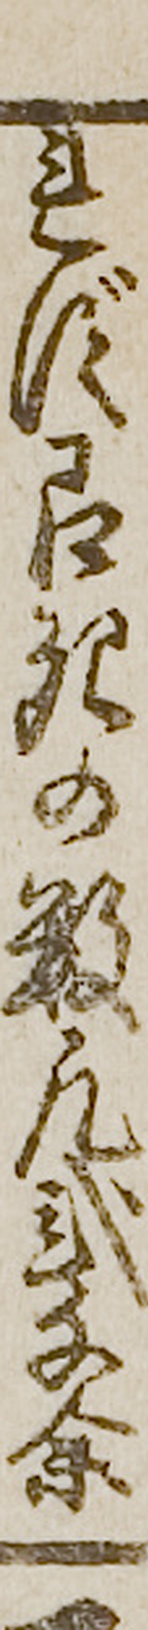れず即死の数凡弐千余
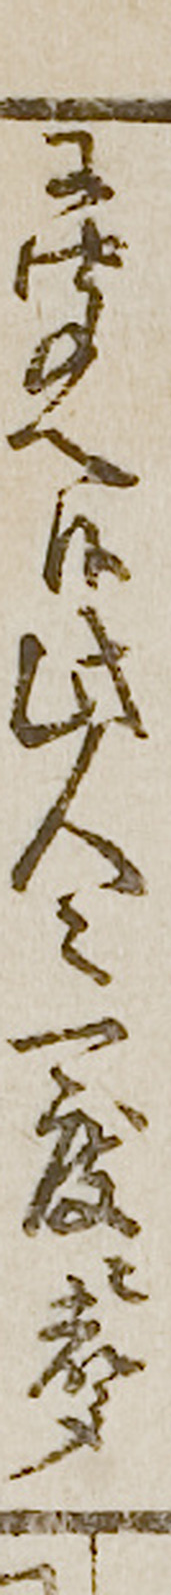に聞へ候此人々一度に声
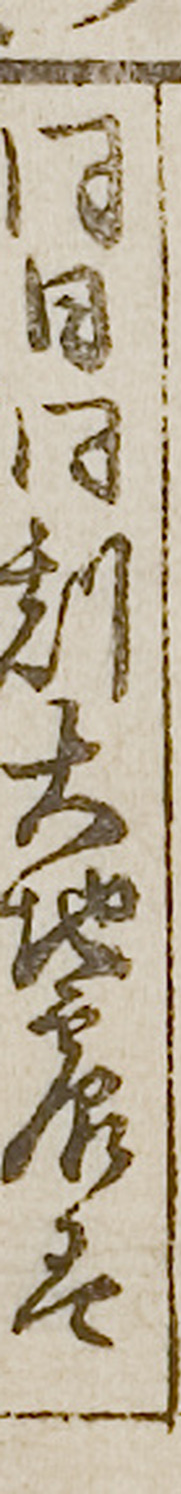同日同刻大地震にて
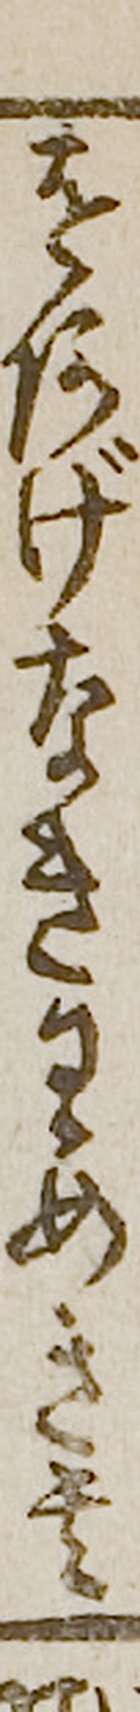をあげなきわめき其
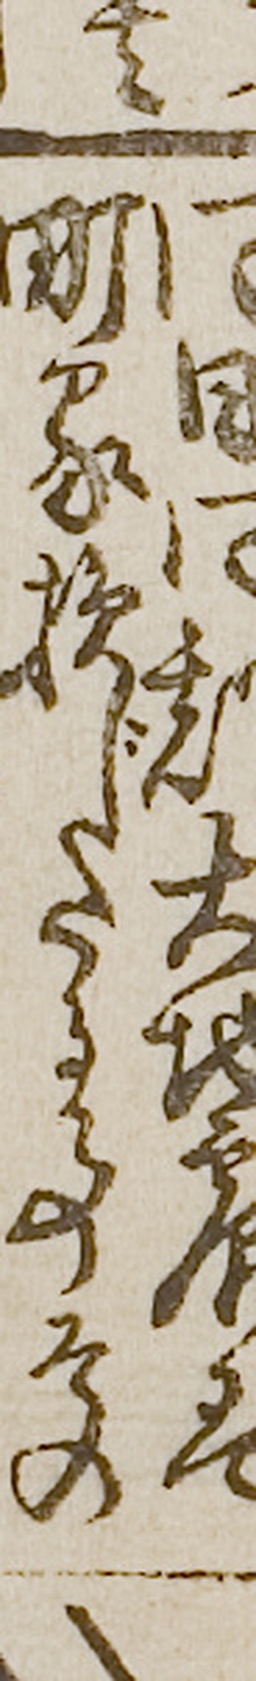町家損じたる事その
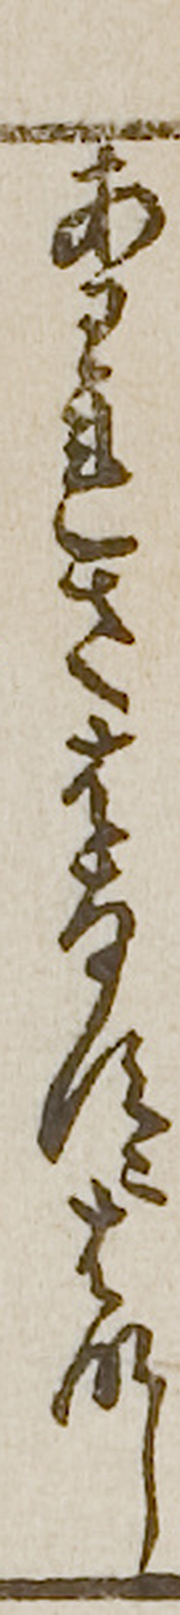あわれさはなすにはなし
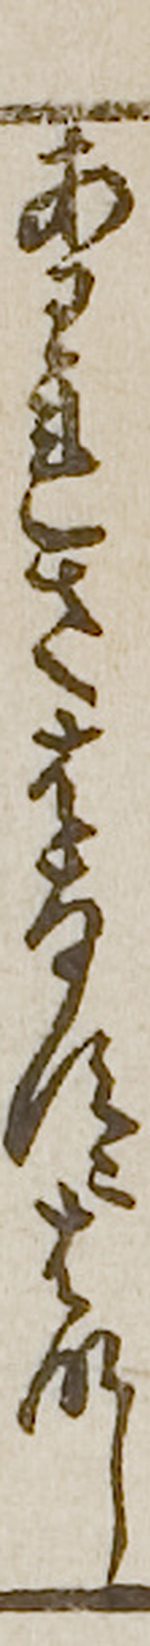あわれさはなすにはなし
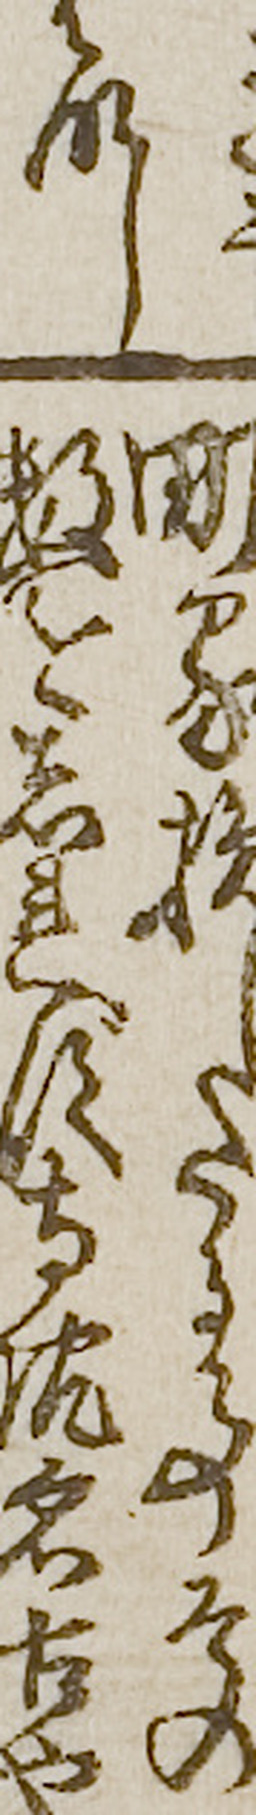数をしれず寺院名古や
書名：諸国大地震大津波 三編
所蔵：東京大学総合図書館 General Library in the University of Tokyo, JAPAN
